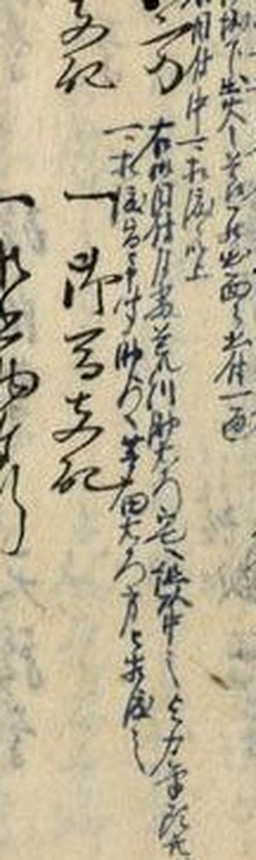可相渡旨被申聞助右衛門へ芦田右衛門方被相渡之
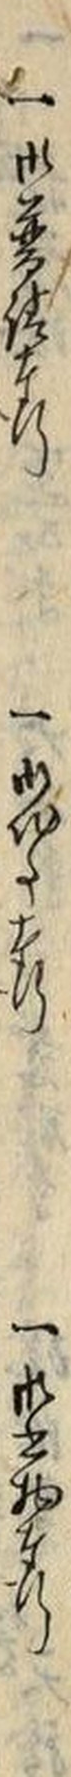一御普請奉行一御作事奉行一御書物奉行
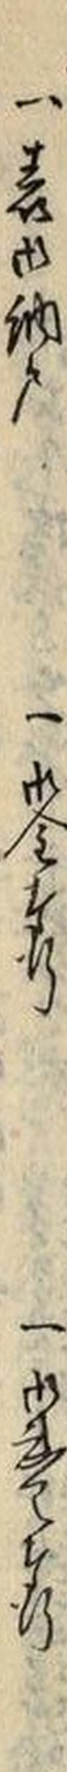一表御納戸一御金奉行一御武具奉行
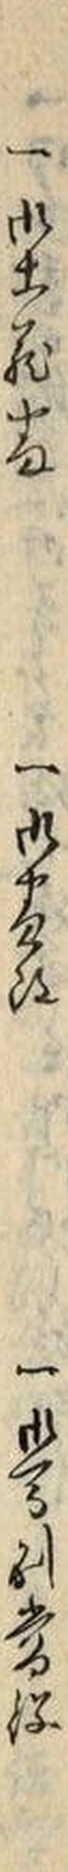一御土蔵番一御番改一御馬別当役
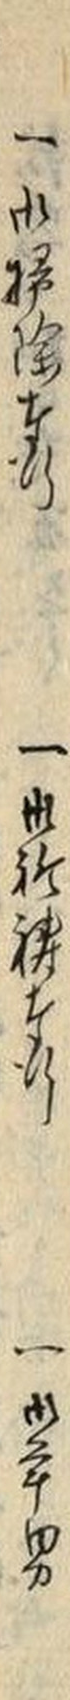一御掃除奉行一御祈祷奉行一御年男
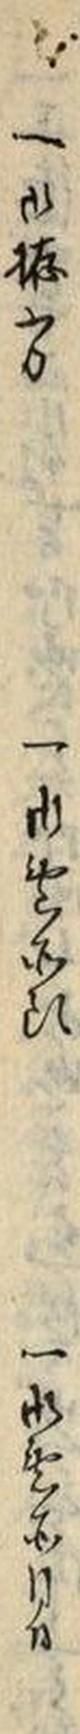一御拵方一御台所頭一御台所目付
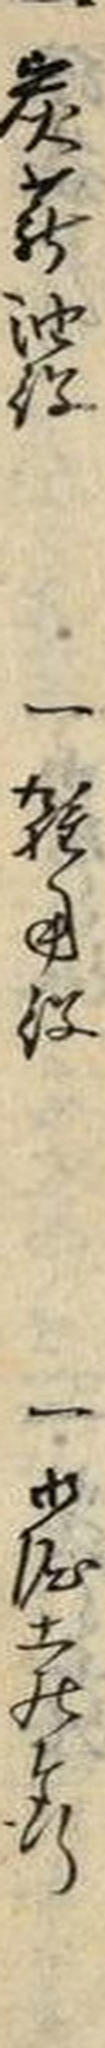一炭薪油役一雑用役一御堀土居奉行

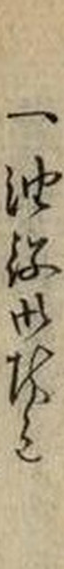一油役御坊主
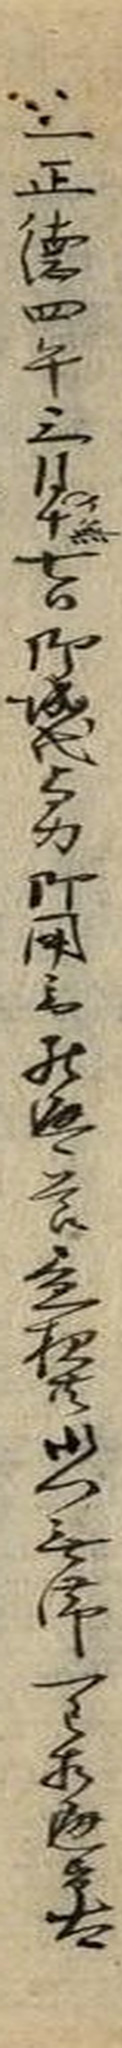一正徳四午三月十七日御城代与力御用ニ而罷通候節昼夜共御門無滞可被相通旨太
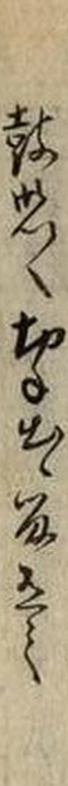鼓御門へ切手出候留有之
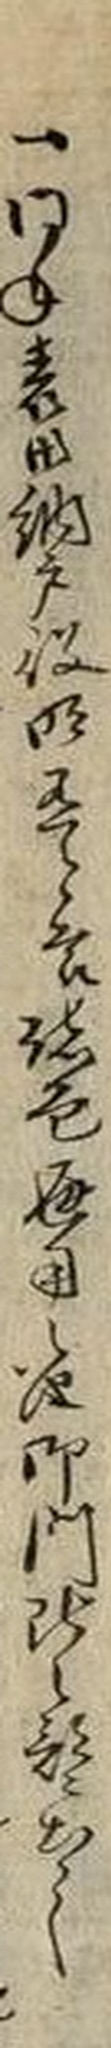一同年表御納戸役明有之候節諸色通用之儀御門断之部ニ出之
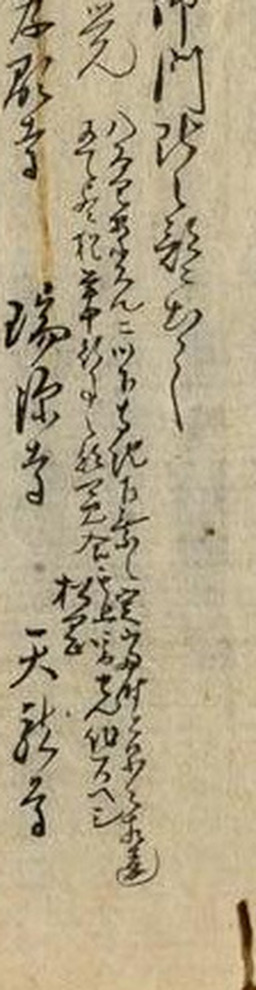八百里案スルニ以下寺院下乗之定当時之品ニ相違
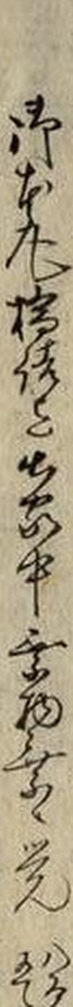御本丸橋詰迄出家中乗物乗之覚
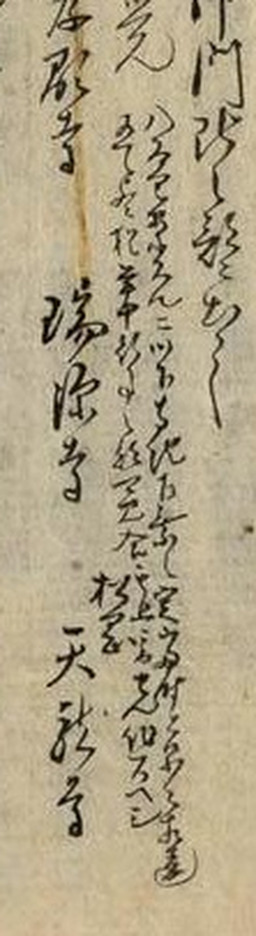有之歟猶年中行事之類可見合其上ニ而先作スヘシ
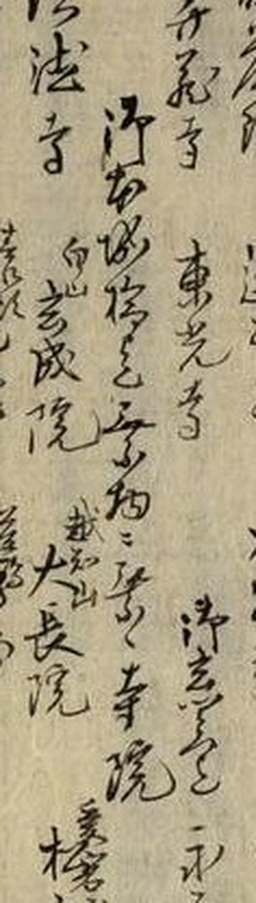御本城橋迄乗物ニ乗候寺院
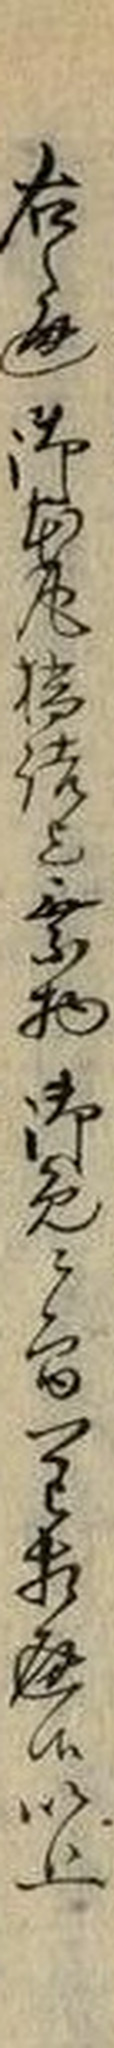右之通御本丸橋詰迄乗物御免ニ候間可被相通候以上
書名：御門御櫓之部
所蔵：福井県文書館 Fukui Prefectural Archives
